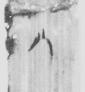人
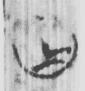曰
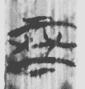亞
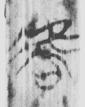唬
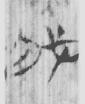我
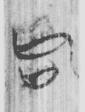句
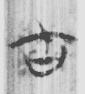古
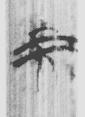天
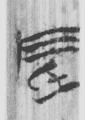砥
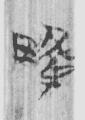降
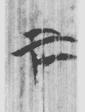下
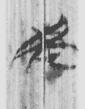民
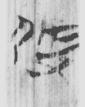{尸拃}
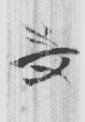寺
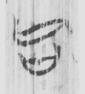句
